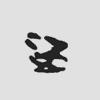是
